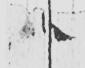八
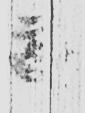百
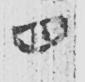四
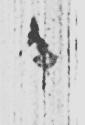千
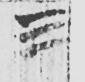三
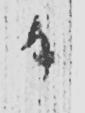千
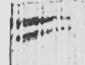二
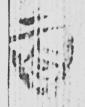百
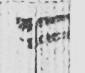二
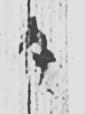千
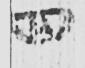四
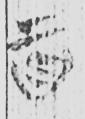百
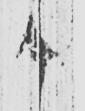千
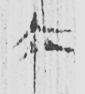六
